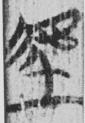○（吾）
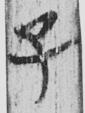子
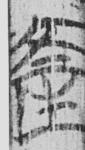產
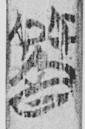○（孰）
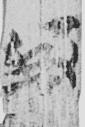臤（賢）
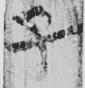子
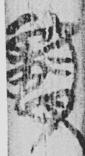贛（貢）
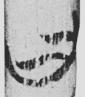曰
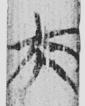夫
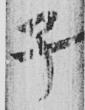子
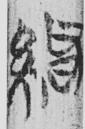○（治）
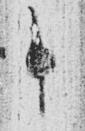十
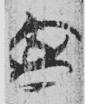室
